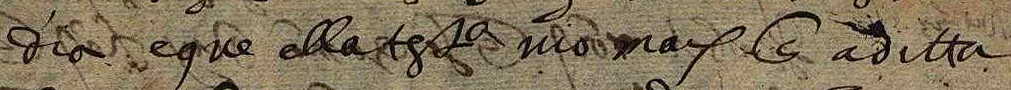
dia e que ella testa uio mais q̄ a ditta
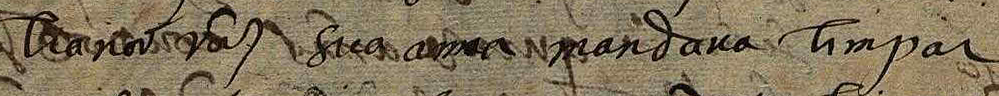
lianor rōiz sua ama mandaua limpar
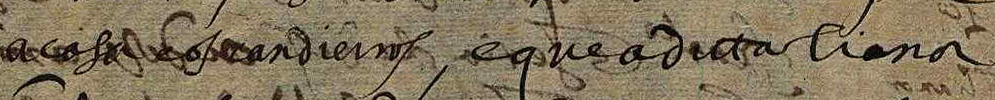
a casa e os candieiros, e que a ditta lianor
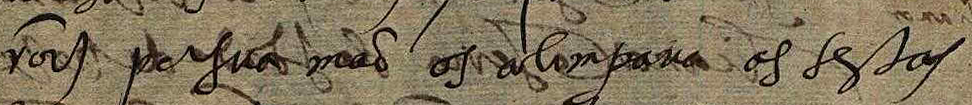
rōiz por sua maõ os alimpaua as sestas
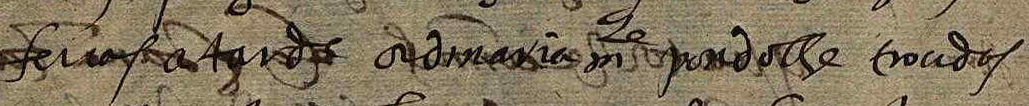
feiras a tarde ordinariamte pondolhe trocidas
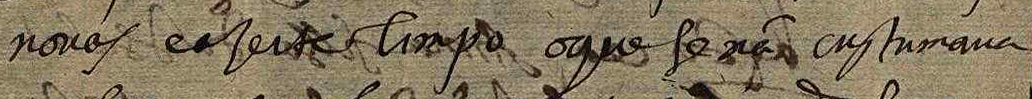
nouas e azeite limpo o que se não custumaua
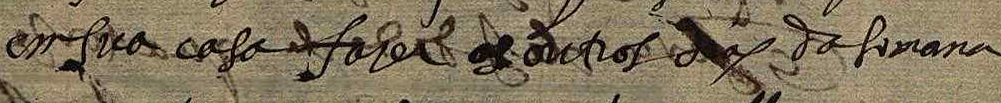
em sua casa fazer os outros dias da somana
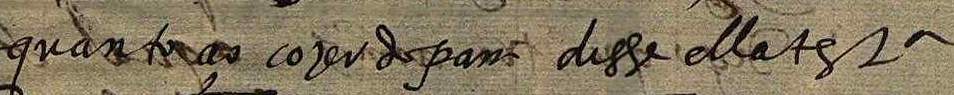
e quanto ao cozer do pam disse ella testa
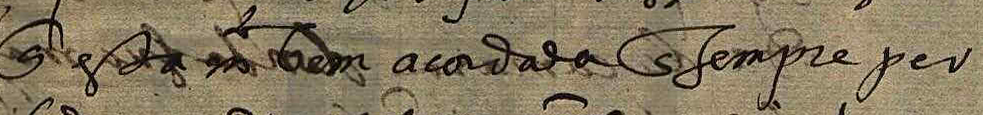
q̄ esta mto bem acordada q̄ sempre per
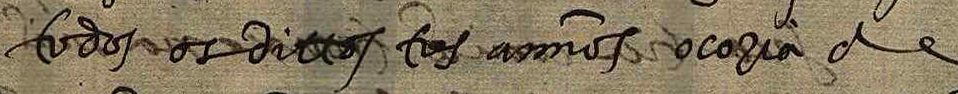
todos os dittos tres ann̄os o cozia de
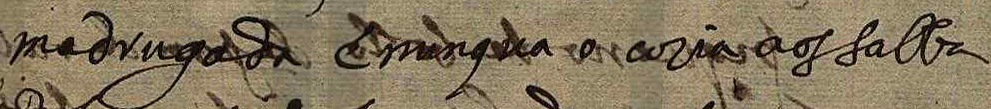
madrugada e nunqua o cozia aos sabba
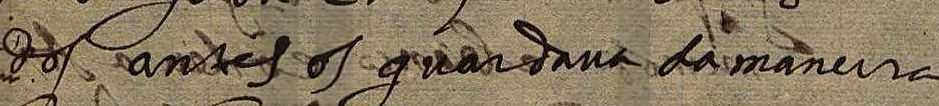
dos antes os guardaua da maneira
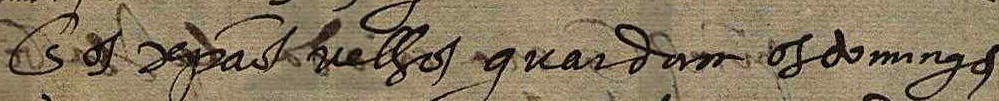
q̄ os xpãos uelhos guardam os domingos
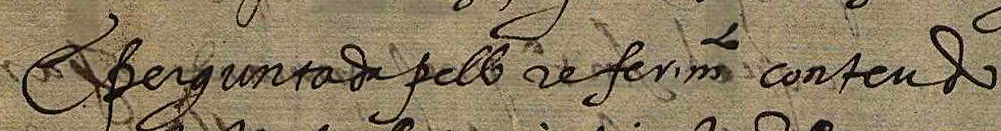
E perguntada pello referimto conteudo
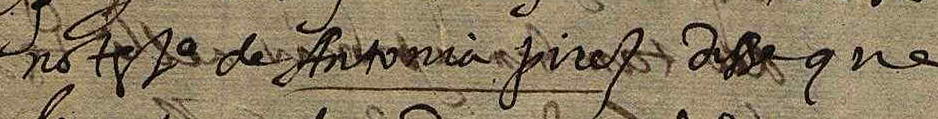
no testo de Antonia pirez disse que
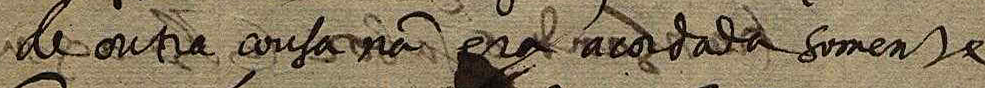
de outra cousa nā era acordada somente
